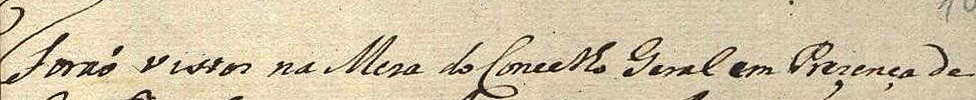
Foraõ vistos na Meza do Concelho Geral em Prezença de
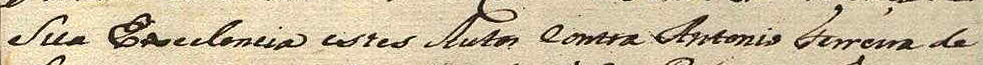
Sua Excelencia estes Autos contra Antonio Ferreira de
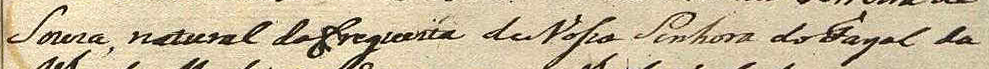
Souza, natural da freguezia de Nossa Senhora do Fayal da
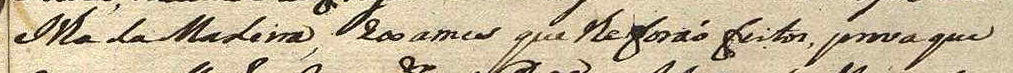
Ilha da Madeira, Exames que lhe foraõ feitos, prova que
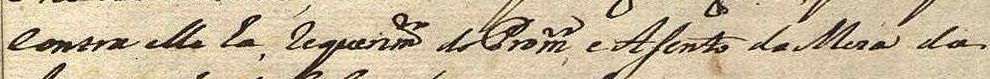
contra elle ha, Requerim.to do Prom.or, e Asento da Mesa da
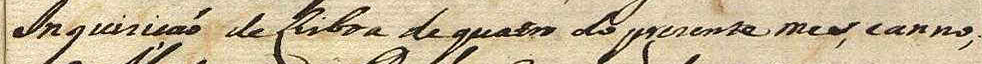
Inquiziçaõ de Lisboa de quatro do prezente mes, e anno,
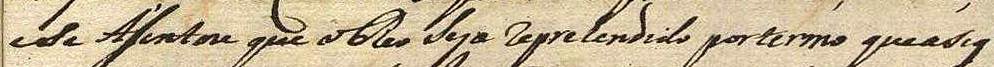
e se Asentou que o Reo seja Reprehendido por termo que asig
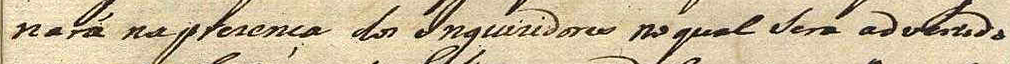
nará na prezença dos Inquizidores no qual sera advertido
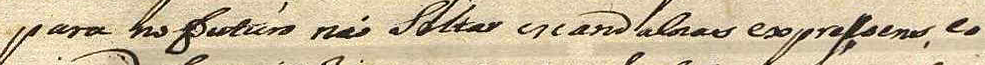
para no futuro naõ soltar escandalozas expresoens, co
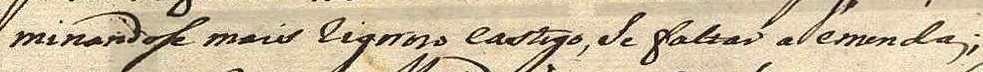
minandose mais Rigorozo castigo, se faltar a emenda;
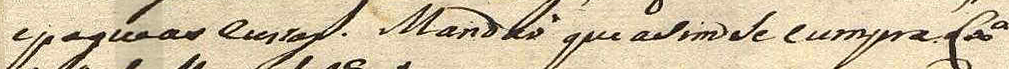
e pague as custas: Mandaõ que asim se cumpra Lxa
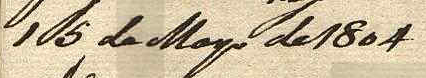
15 de Mayo de 1804
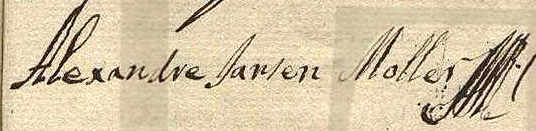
Alexandre Iansen Moller
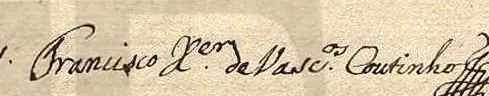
Francisco X.er de Vasc.os Coutinho
